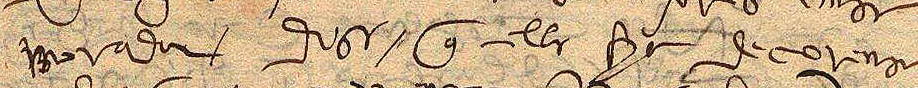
morador / dise / q̄ elle hera de corenta
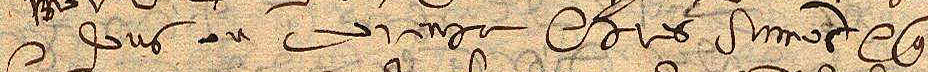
e dous ou corenta e tres Annōs e q̄
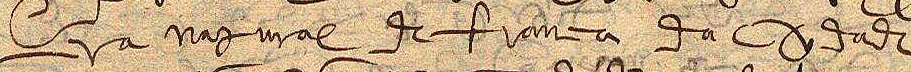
era natural de frança da Cydade
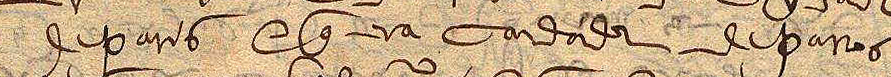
de paris e q̄ era cardador de panos
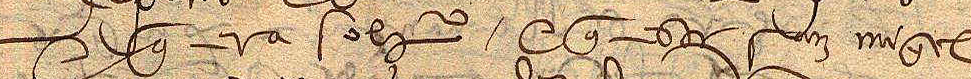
e q̄ era soltro / e q̄ este sam migel
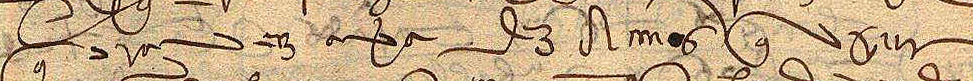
q̄ ora vem aꝟa dez Annos q̄ vyue
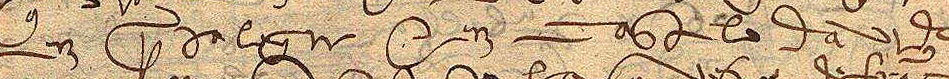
em p̄otalegre e em Castelo da vida
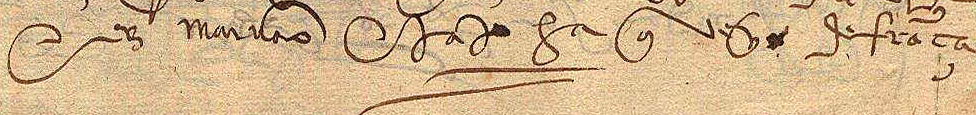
e em maruão e tāto ha q̄ vey_ de frāça
